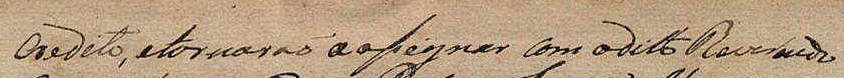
credito, e tornaraõ a assignar com o ditto Reverendo
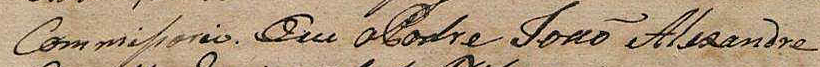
Commissario. E eu o Padre Ioaõ Alexandre
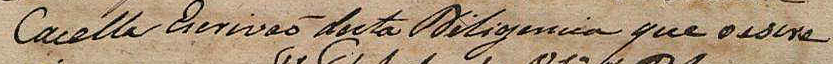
Cacella Escrivaõ desta Diligencia que o escre
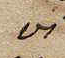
vi
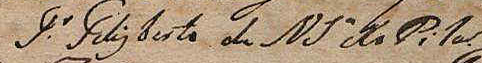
F.r Felisberto de NSa do Pilar
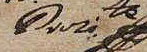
Prezi.te
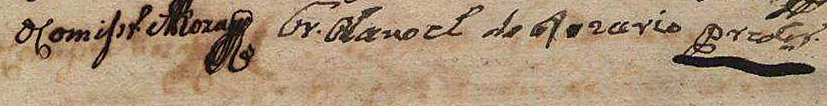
o Comissr.o Roza Fr. Manoel do Rozario predor
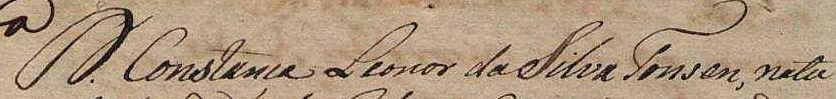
D. Constança Leonor da Silva Tonsen, natu
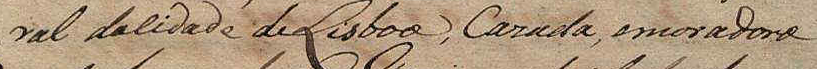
ral da cidade de Lisboa, Cazada, e moradora
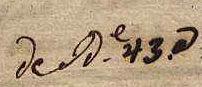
de Id.e 43. ā
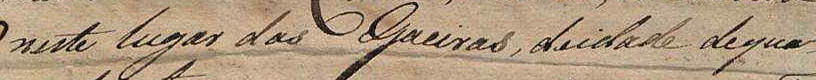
neste lugar das Gaeiras, de idade de qua
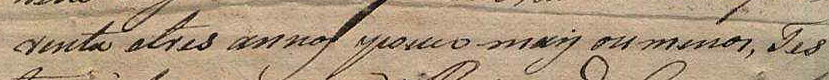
renta e tres annos pouco mais ou menos, Tes
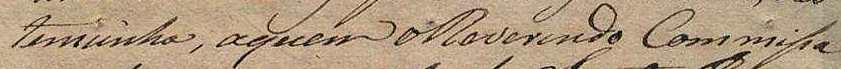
temunha, a quem o Reverendo Commissa
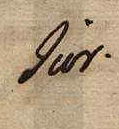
Iur.
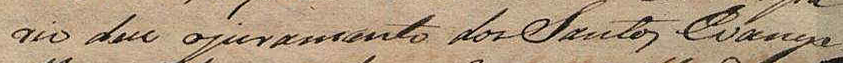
rio deu o juramento dos Santos Evange
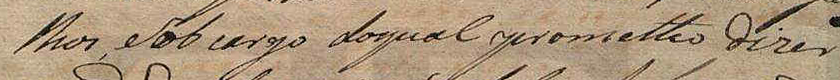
lhos, sob cargo do qual prometteo dizer
